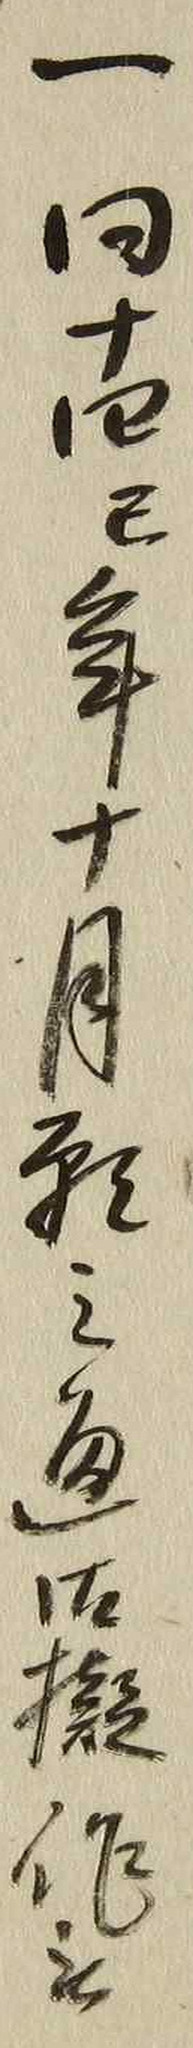一同十四巳年十月願之通御擬作被
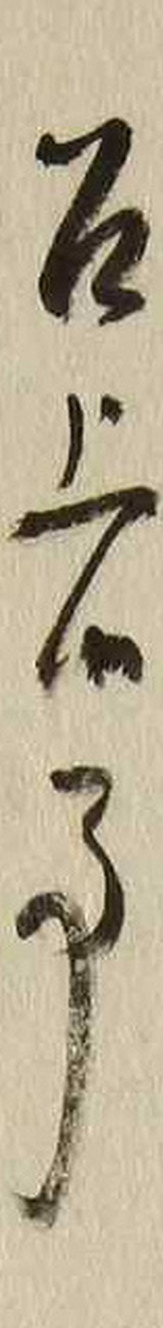召上候事
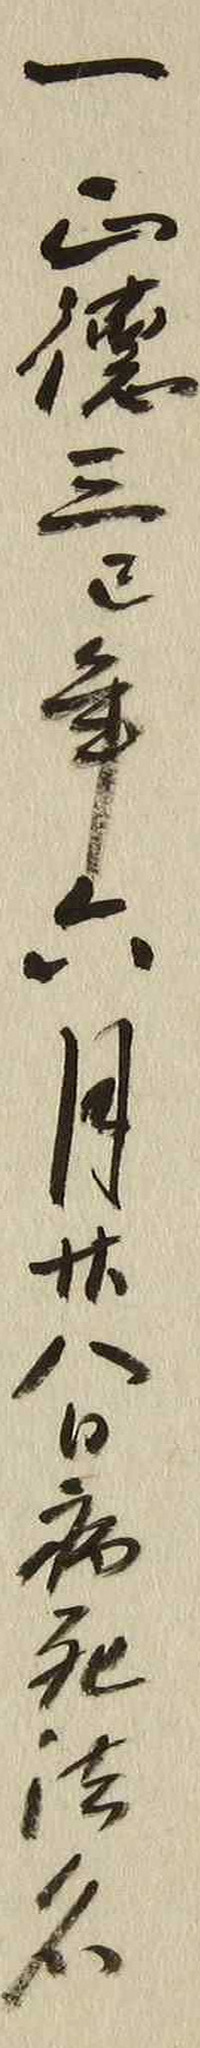一正徳三巳年六月廿八日病死法名
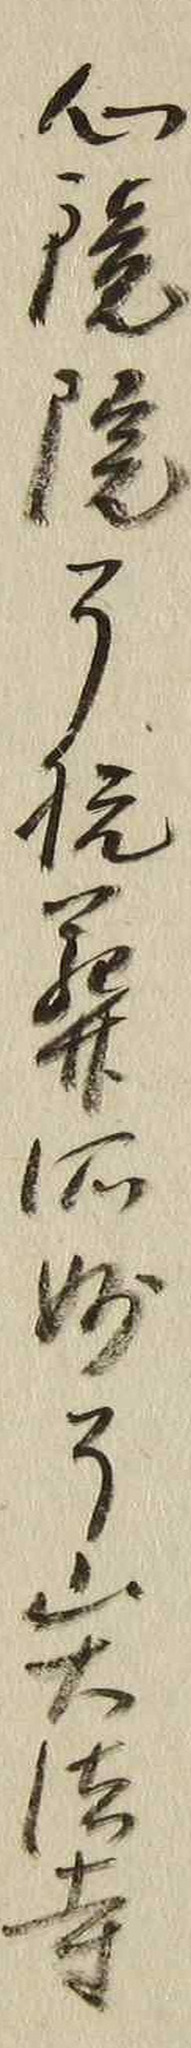心鏡院了悦葬所妙了山大法寺
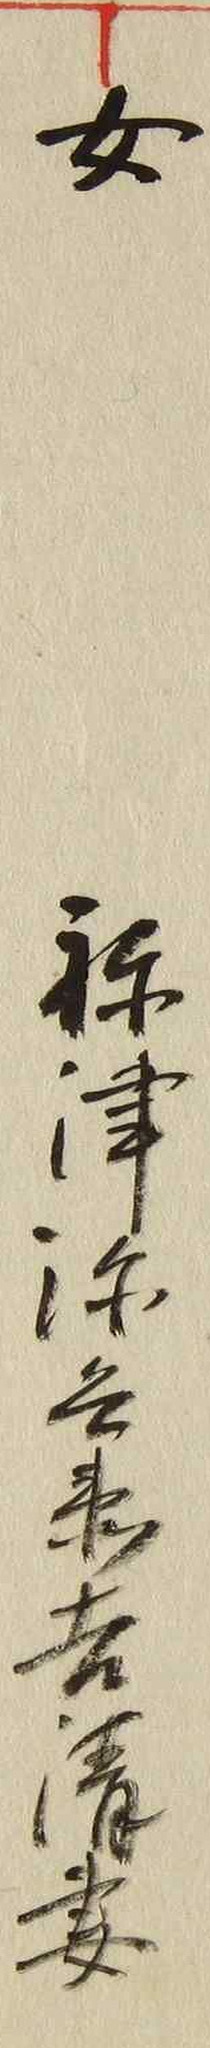女祢津弥兵衛吉清妻
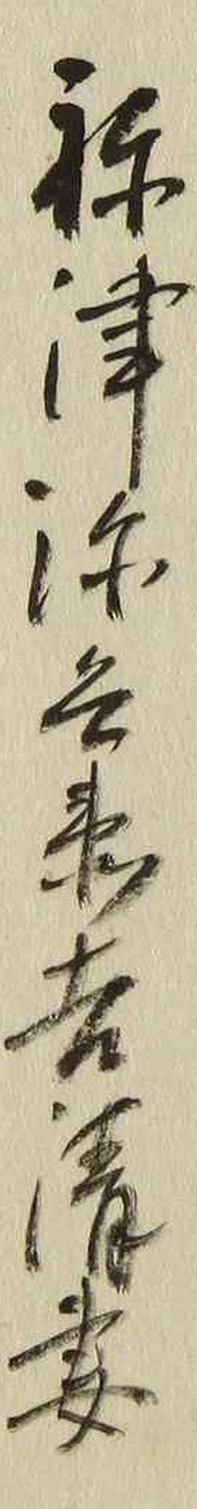女祢津弥兵衛吉清妻
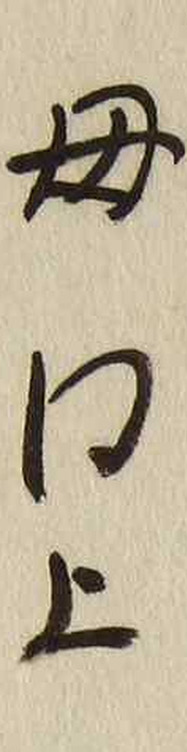母同上
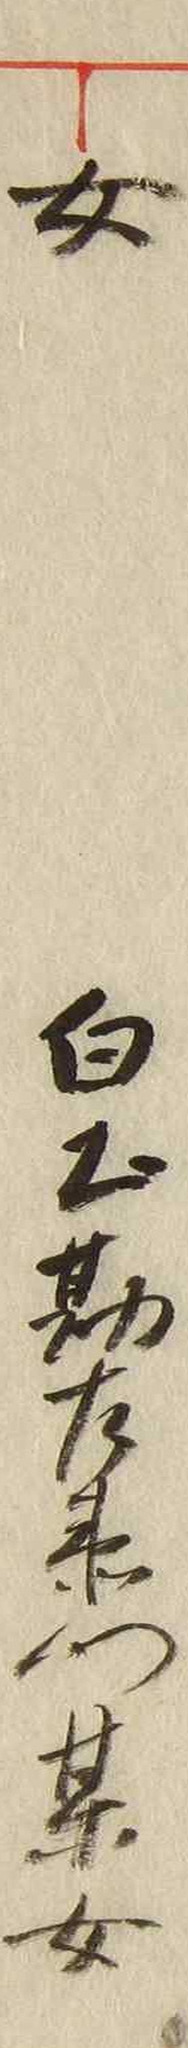女白土勘左衛門某女
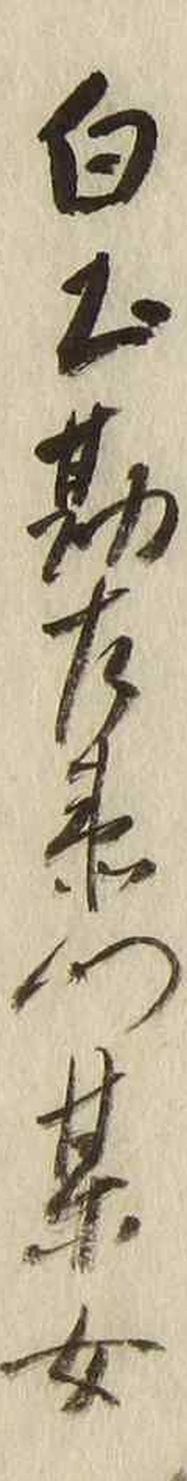女白土勘左衛門某女

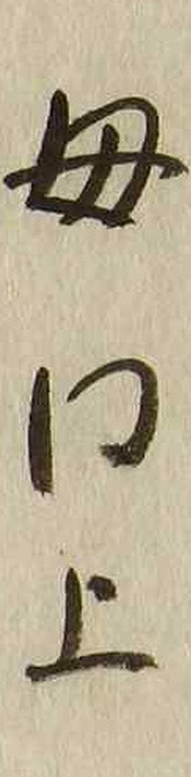母同上
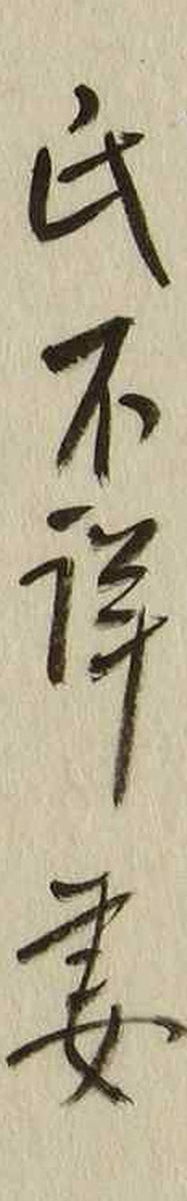氏不詳妻
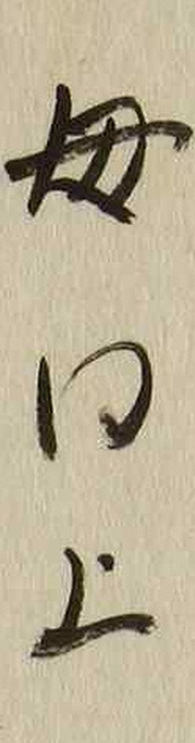母同上
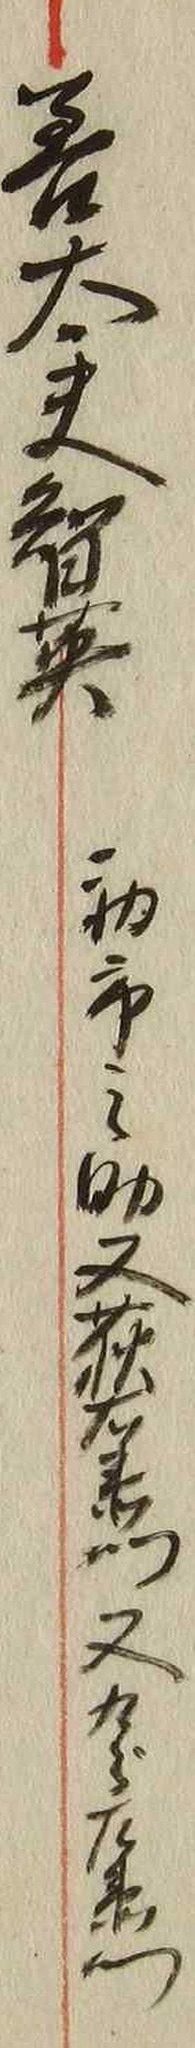善太夫智英初市之助又萩右衛門又九郎左衛門
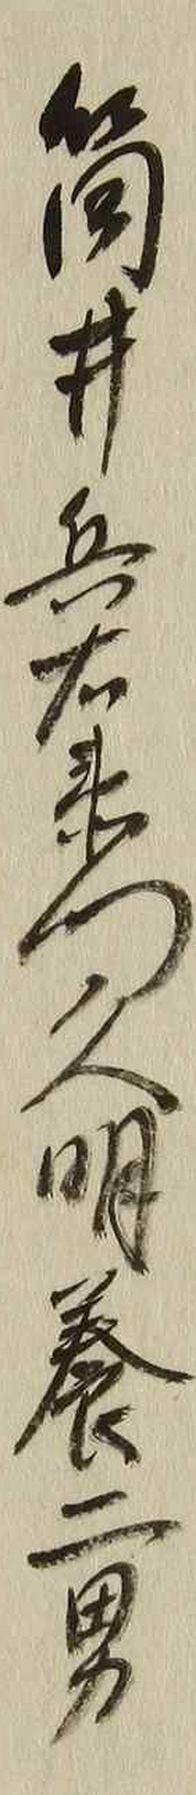筒井兵右衛門久明養二男
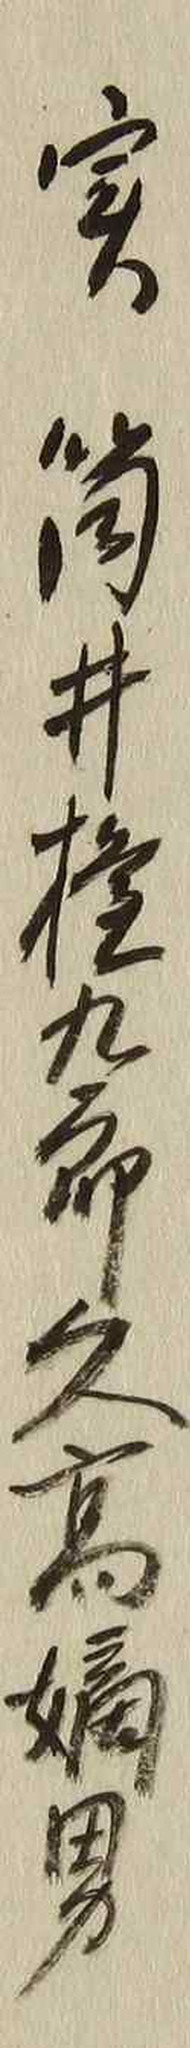実筒井権九郎久髙嫡男
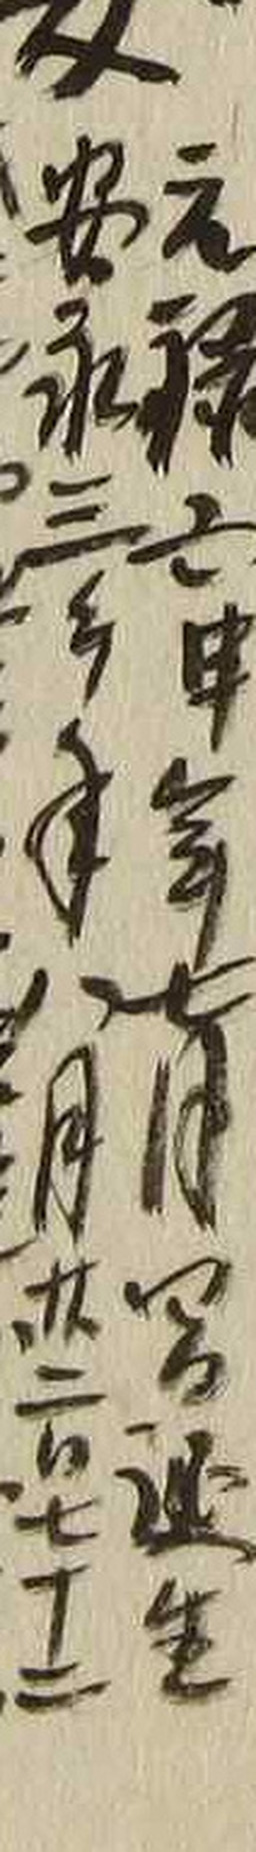安永三午年八月廿二日七十二
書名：諸士系譜　巻之360　す之部10
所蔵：会津若松市立会津図書館
